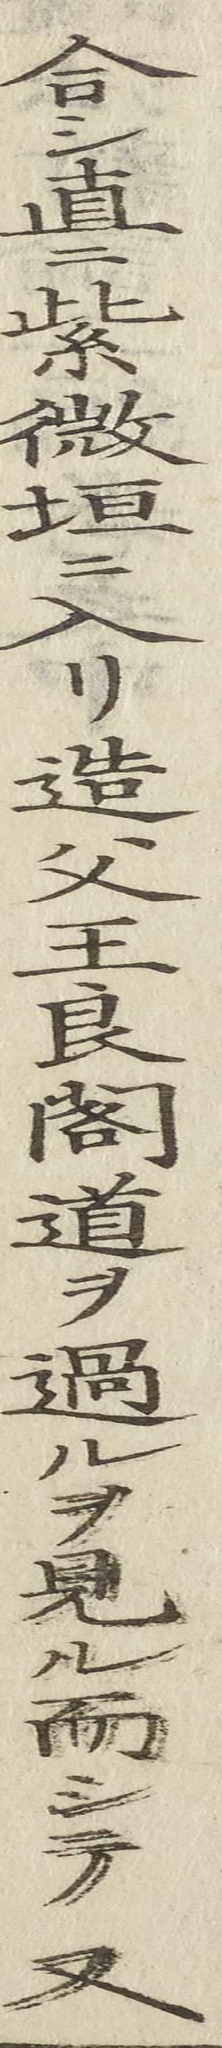合シ直ニ紫微垣ニ入リ造父王良閣道ヲ過ルヲ見ル而シテ又
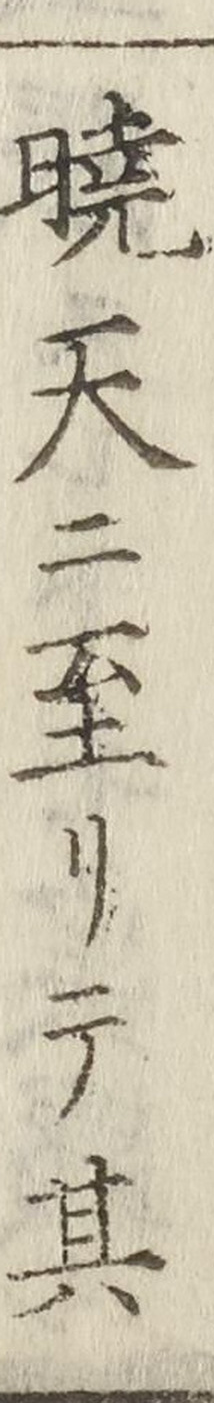暁天ニ至リテ其
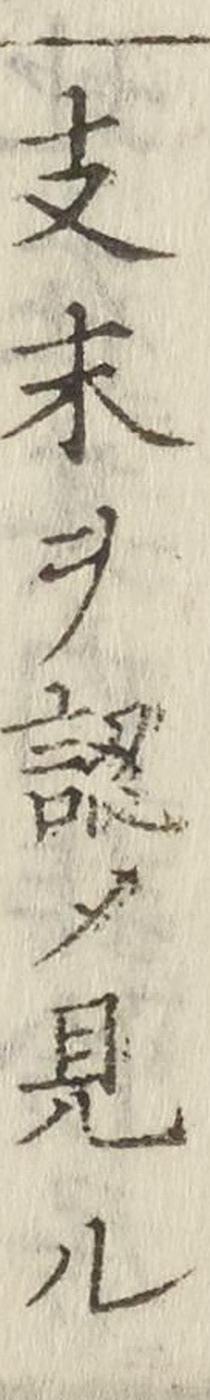支末ヲ認メ見ル
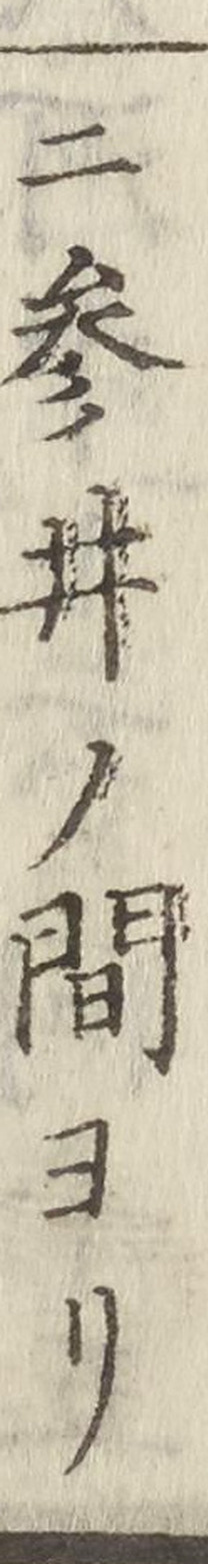ニ参井ノ間ヨリ
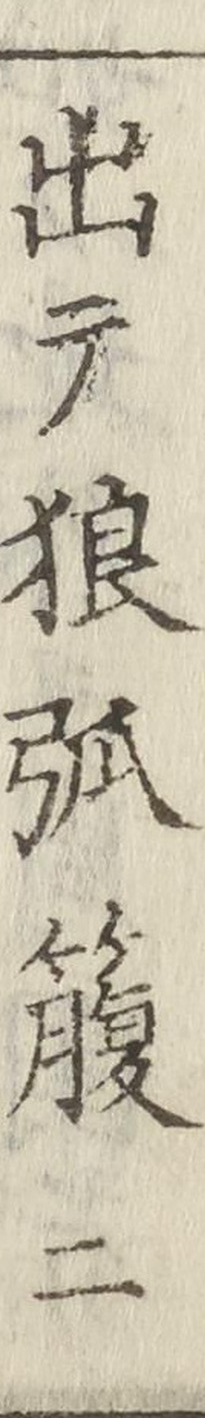出テ狼弧筋？ニ
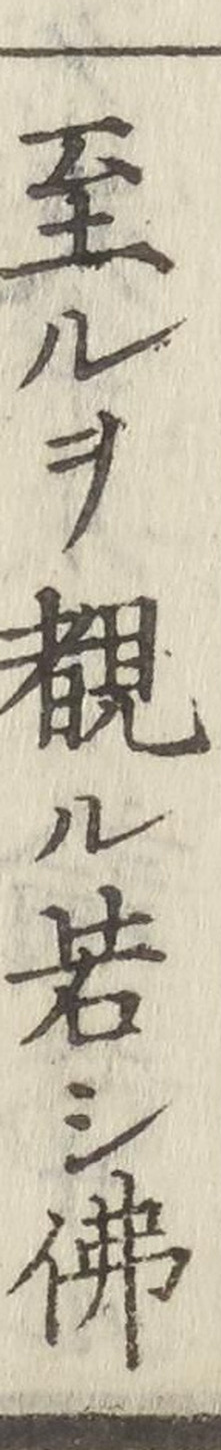至ルヲ覩ル若シ仏
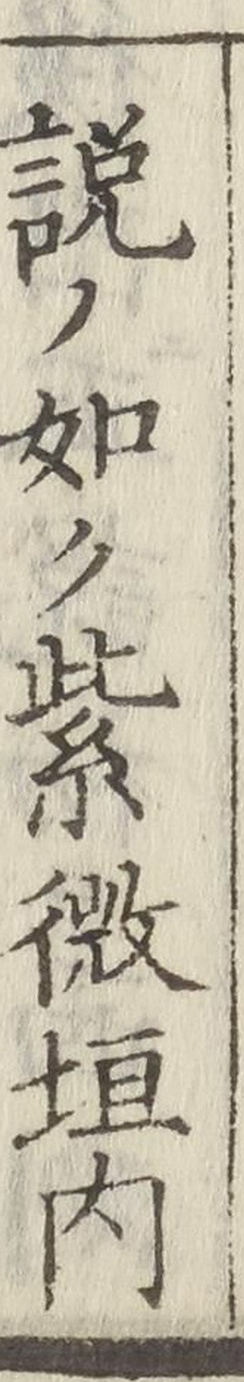説ノ如ク紫微垣内
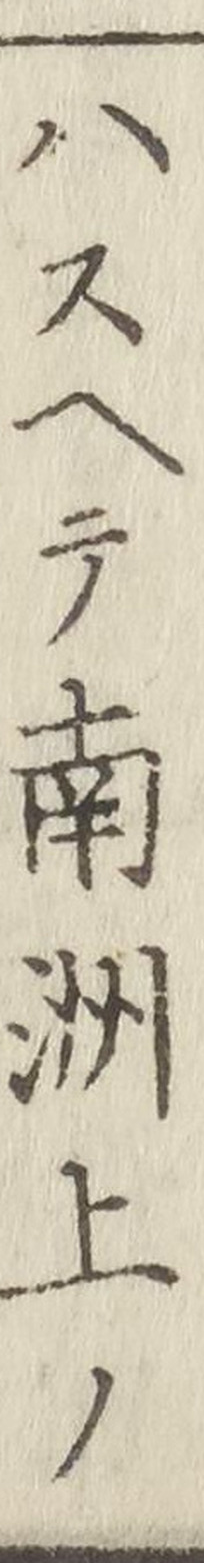ハスヘテ南洲上ノ
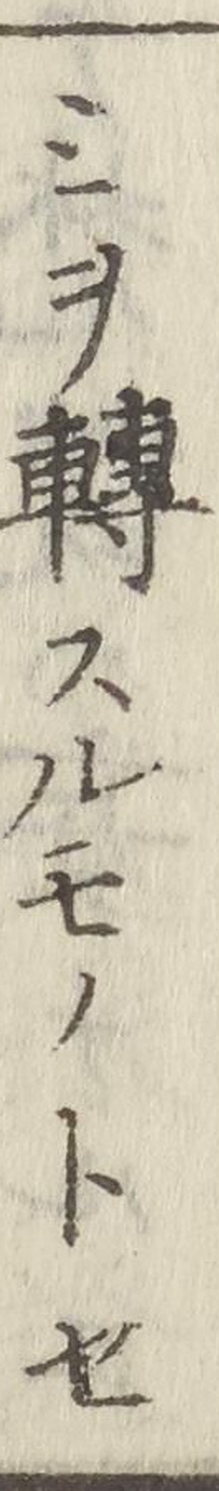ミヲ転スルモノトセ
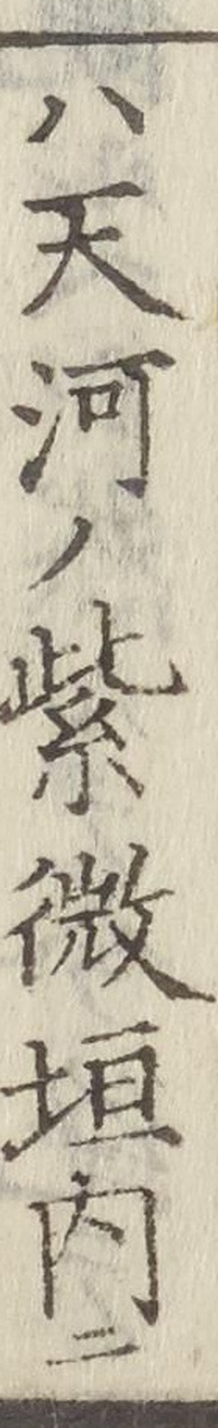ハ天河ノ紫微垣内ニ
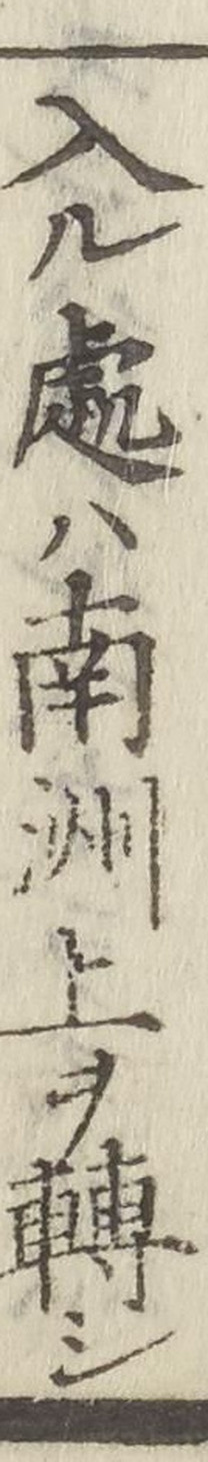入ル処ハ南洲上ヲ転シ

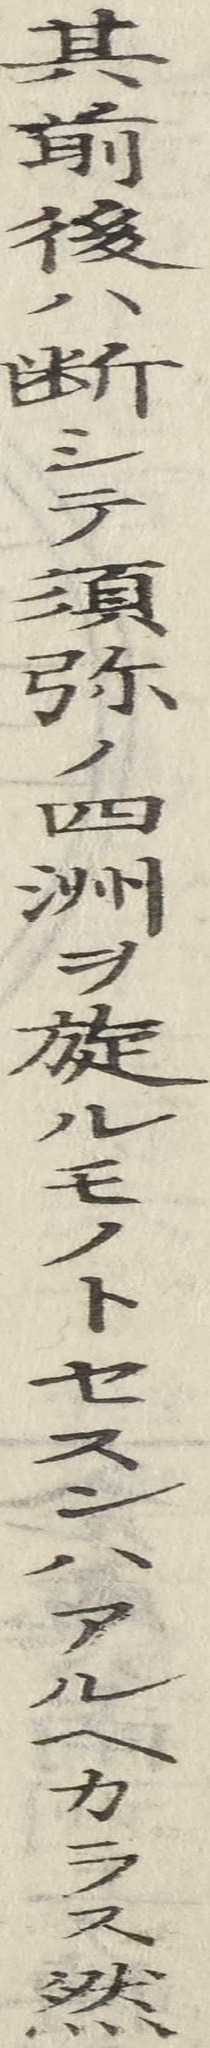其前後ハ断シテ須弥ノ四洲ヲ旋ルモノトセスンハアルヘカラス然
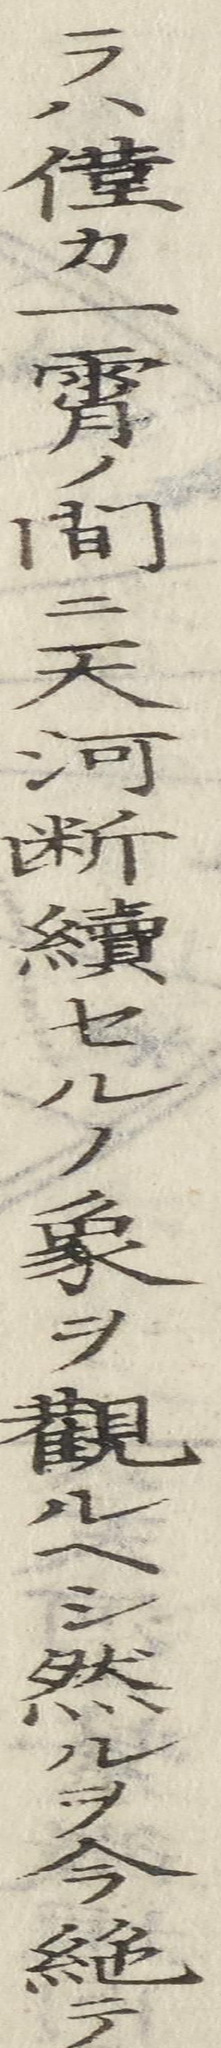ラハ僅カ一霄ノ間ニ天河断続セルノ象ヲ観ルヘシ然ルヲ今絶テ
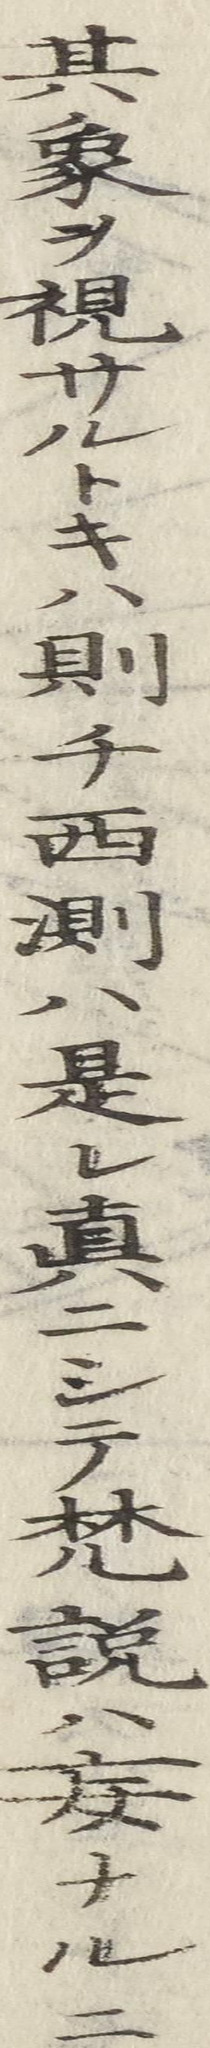其象ヲ視サルトキハ則チ西測ハ是レ真ニシテ梵説ハ妄ナルニ
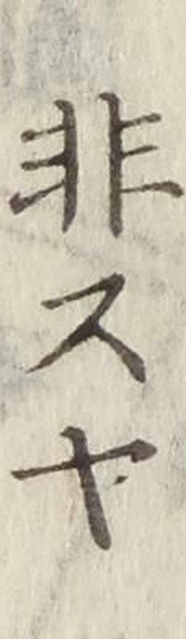非スヤ
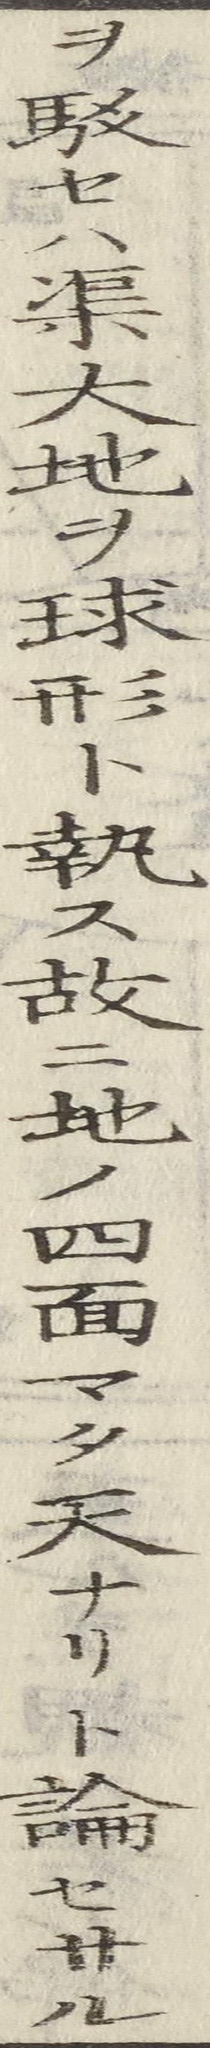ヲ駁セハ渠大地ヲ球形ト執ス故ニ地ノ四面マタ天ナリト論セサル
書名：護法新論　二編　中
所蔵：東京大学地震研究所図書室 Earthquake Research Institute Library, The University of Tokyo, JAPAN
